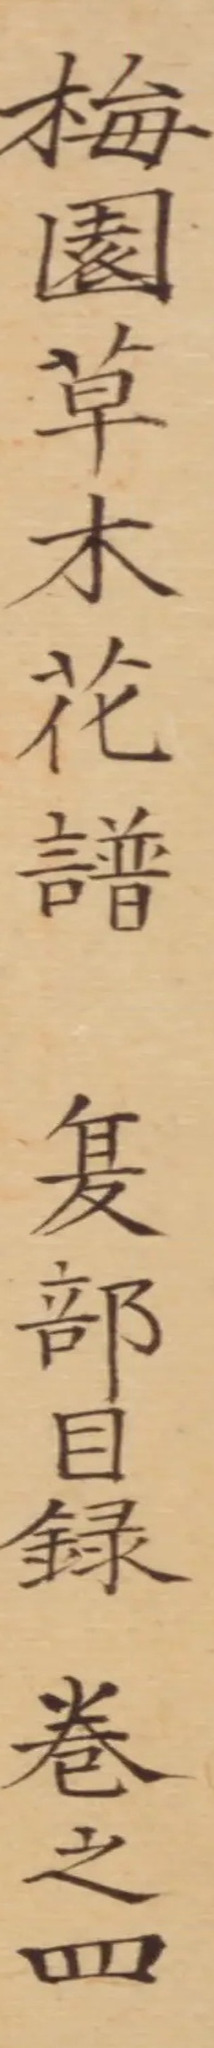梅園草木花譜夏部目録巻之四
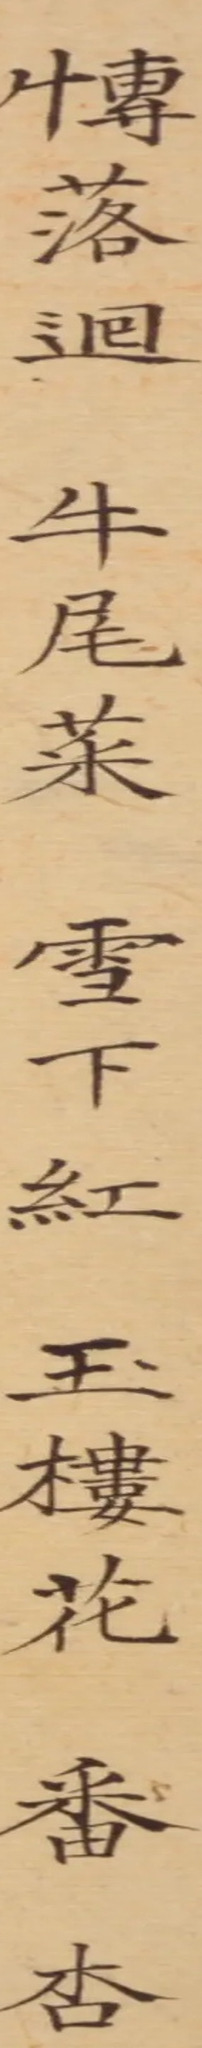博落迥牛尾菜雪下紅珠楼花番杏
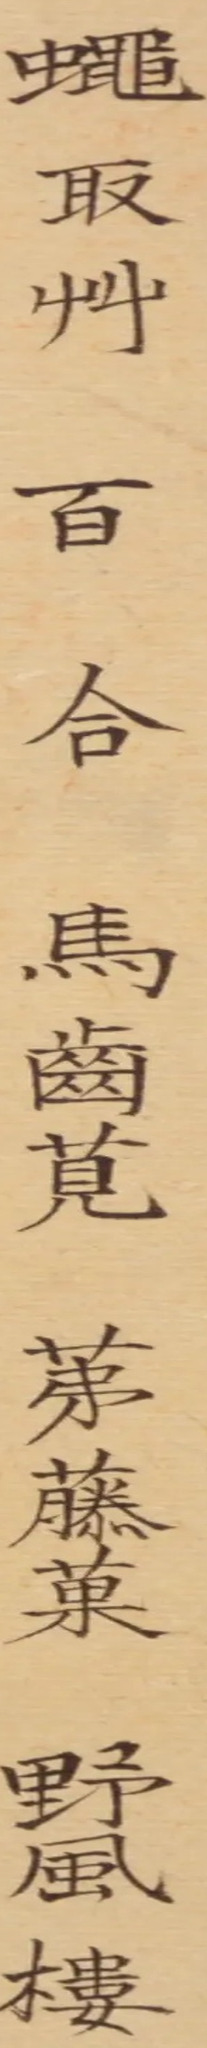蝿取艸百合馬歯莧荑藤菓野風楼
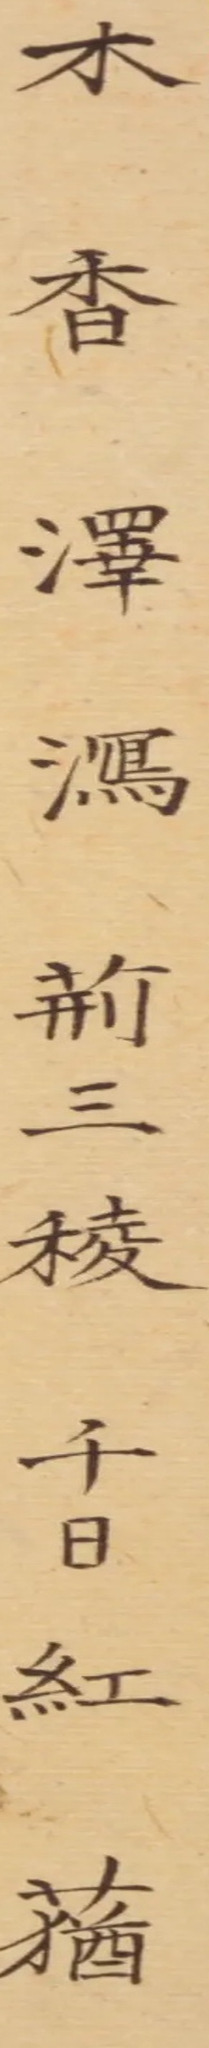木香沢瀉荊三稜千日紅蕕
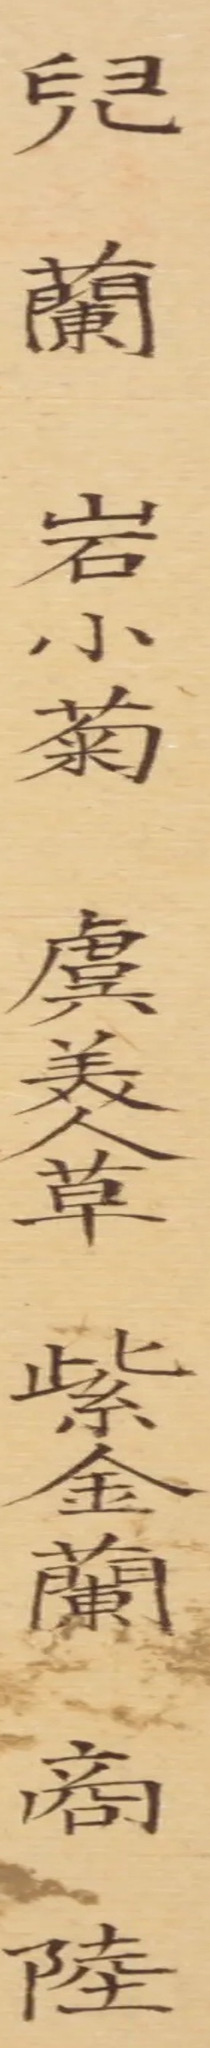児蘭岩小菊虞美人草紫金蘭商陸
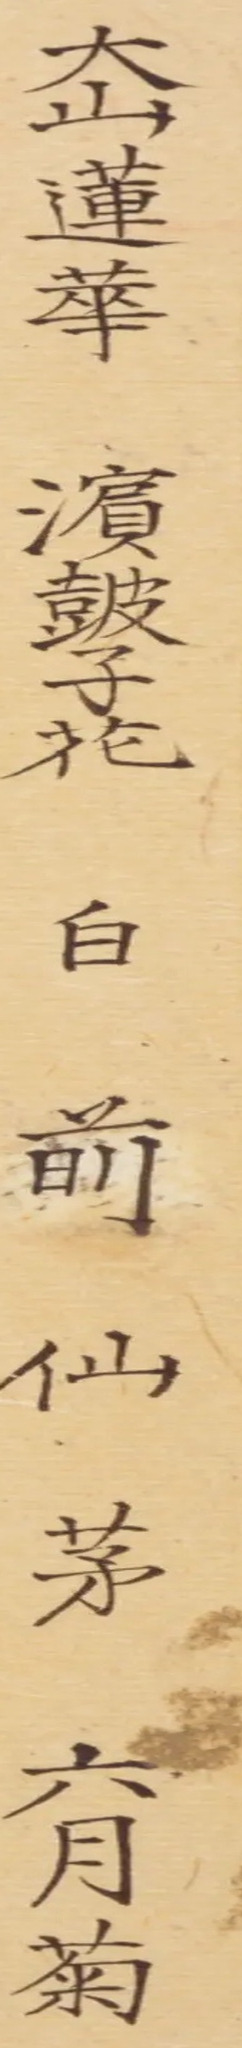大山蓮華浜皷子花白前仙茅六月菊
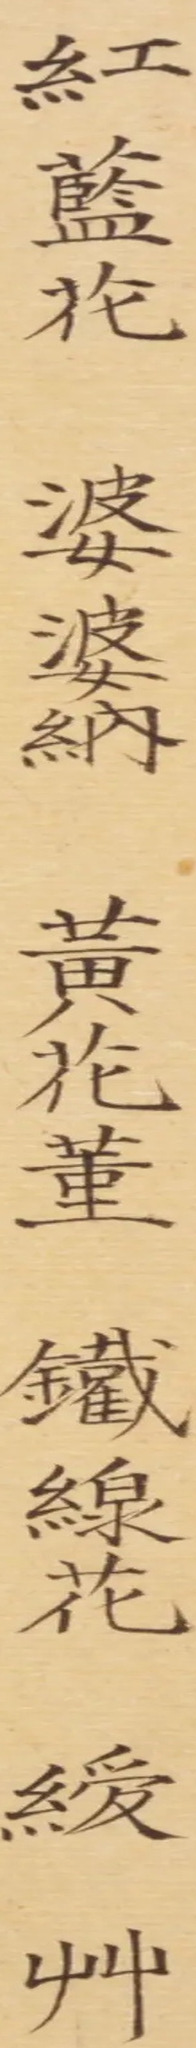紅藍花婆婆納黄花菫鉄線花綬草
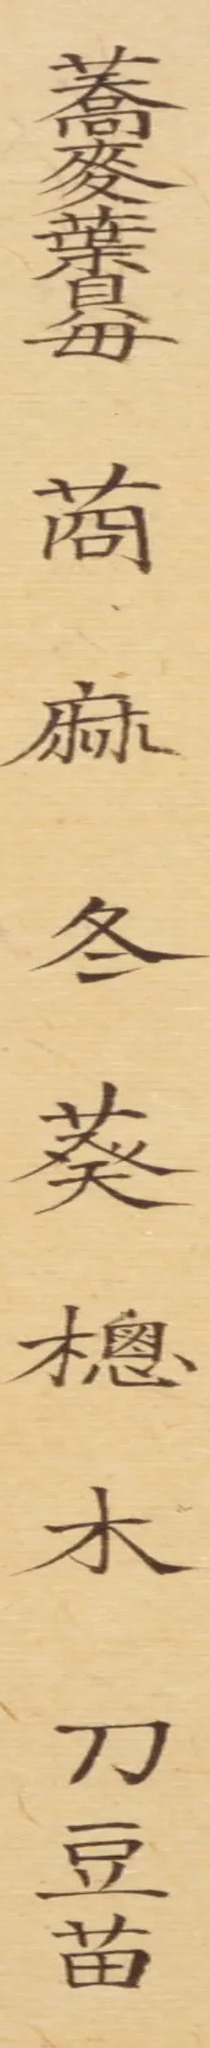蕎麦葉貝母莔麻冬葵楤木刀豆苗
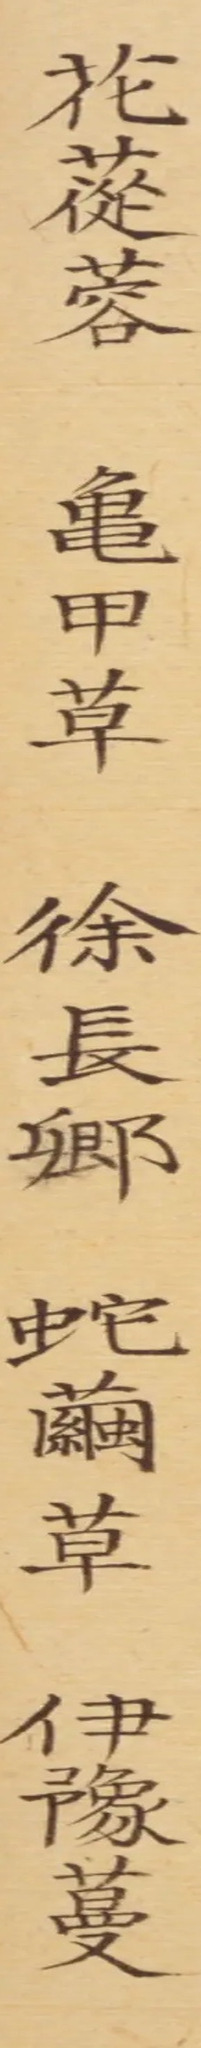花蓯蓉亀甲草徐長卿蛇繭草伊予葛
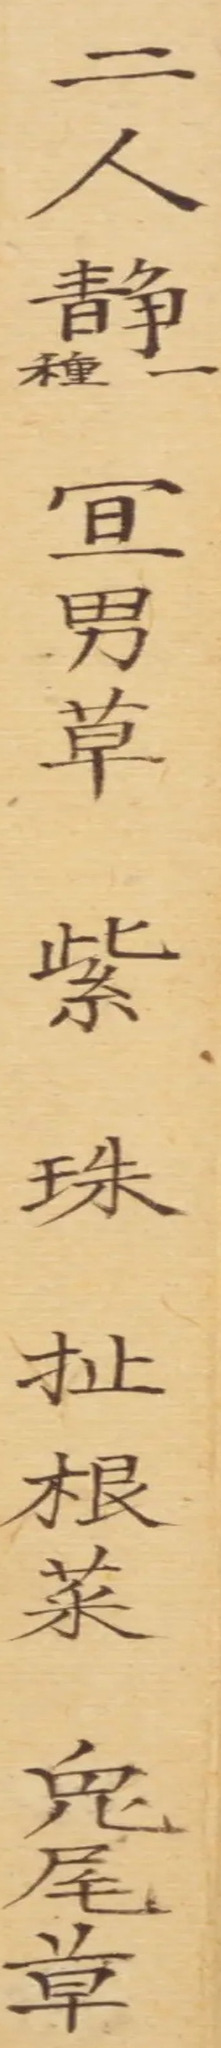二人静一種男草紫珠扯根菜兎尾草
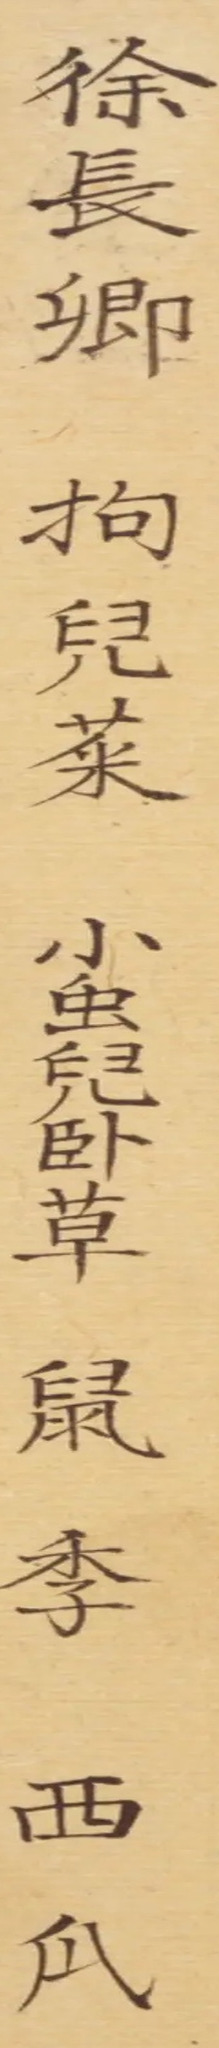徐長卿枸児菜小虫児臥草鼠李西瓜
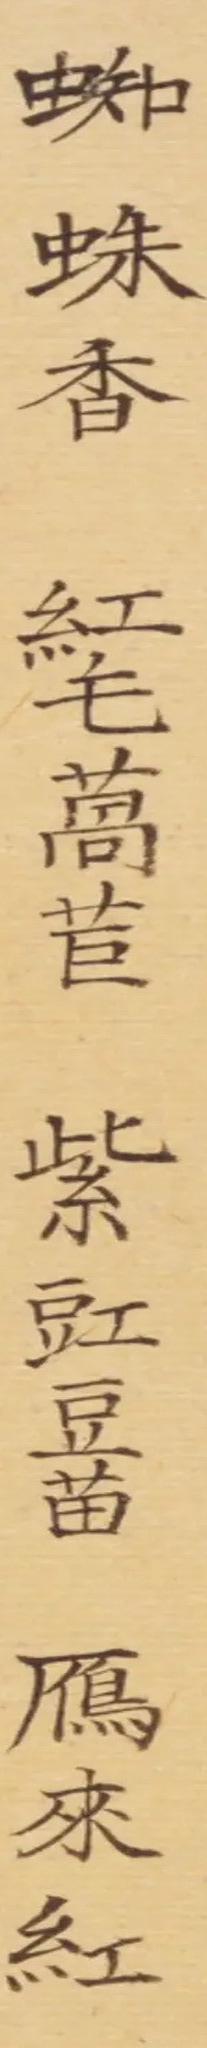蜘蛛香紅毛萵苣紫豇豆苗雁来紅
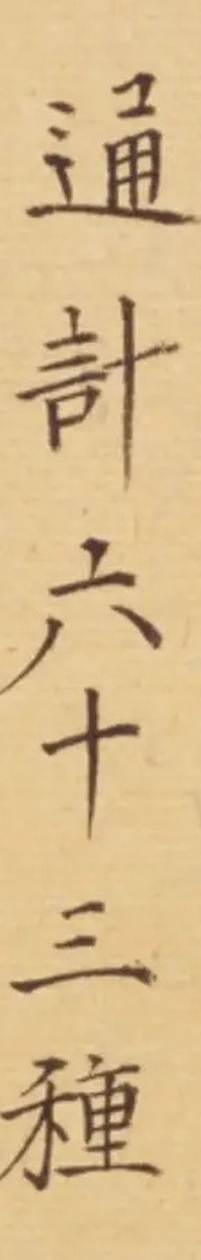通計六十三種
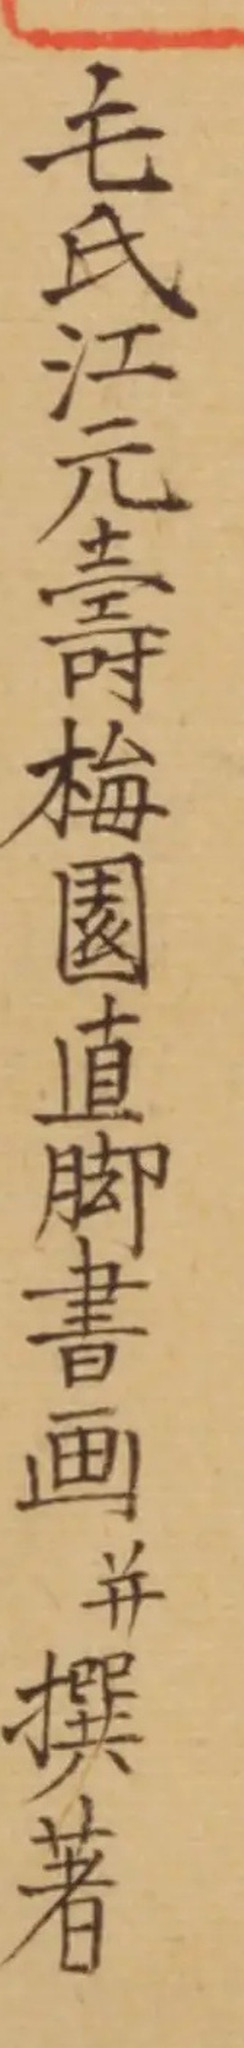毛氏江元寿梅園直脚書画并撰著

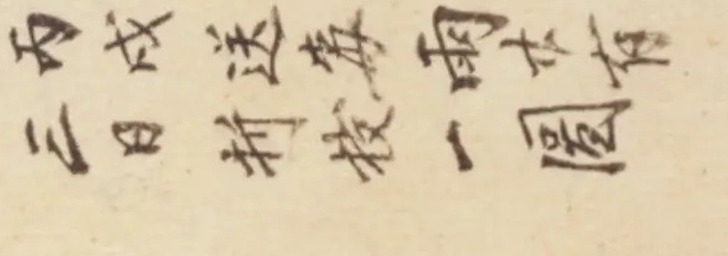三日折枝一図
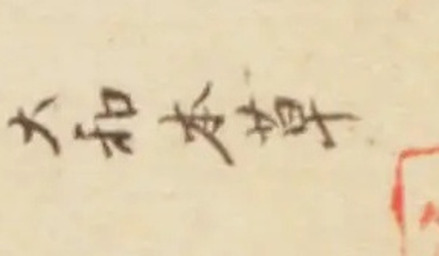大和本草
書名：梅園草木花譜夏之部. 4
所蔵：国立国会図書館 National Diet Library, JAPAN
